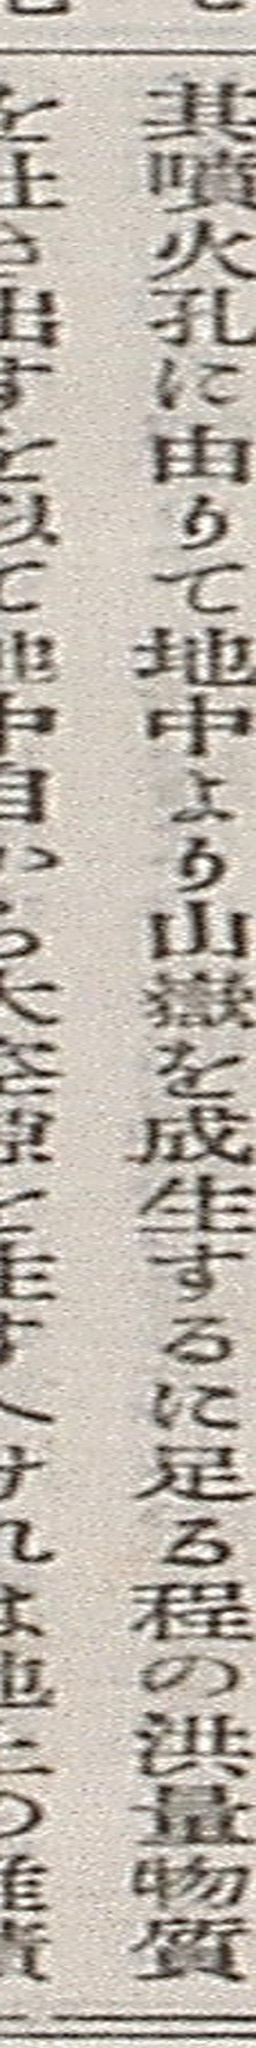を吐き出すを以て地中自から大空隙を生すへけれは地上の堆積
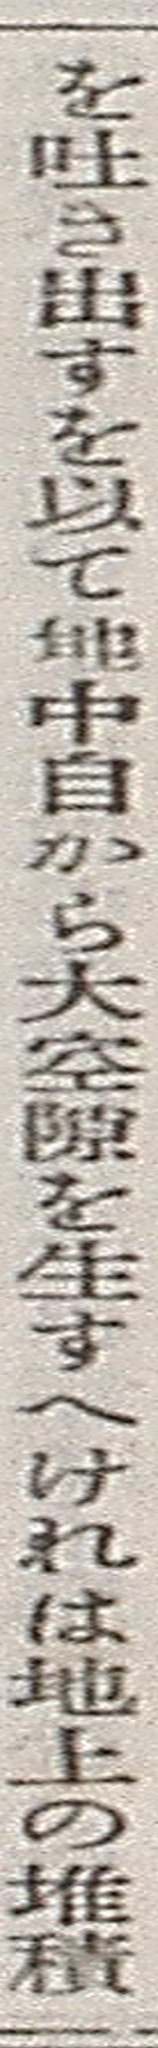を吐き出すを以て地中自から大空隙を生すへけれは地上の堆積
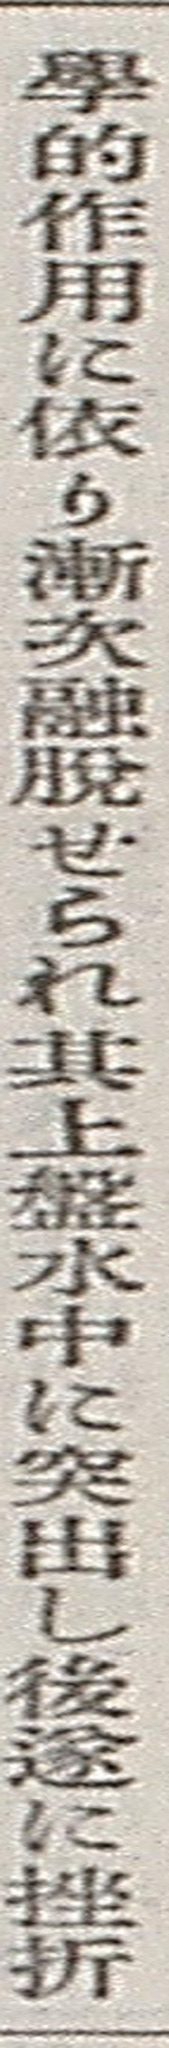学的作用に依り漸次融脱せられ其上盤水中に突出し後遂に挫折
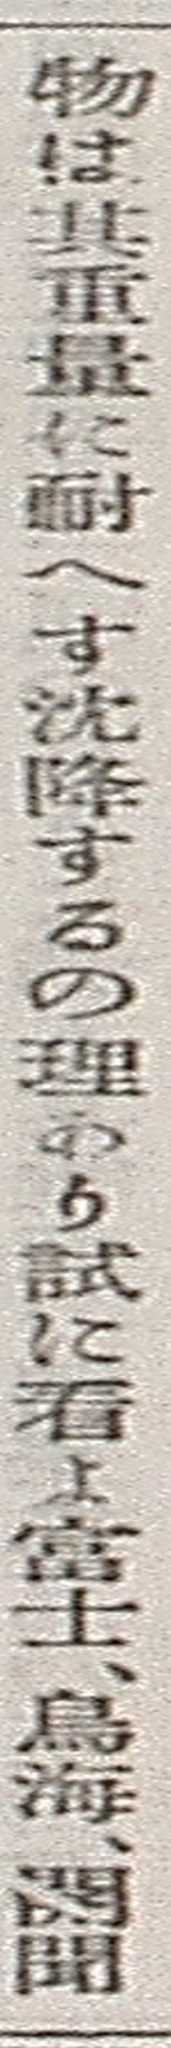物は其重量に耐へす沈降するの理あり試に看よ富士、鳥海、開聞
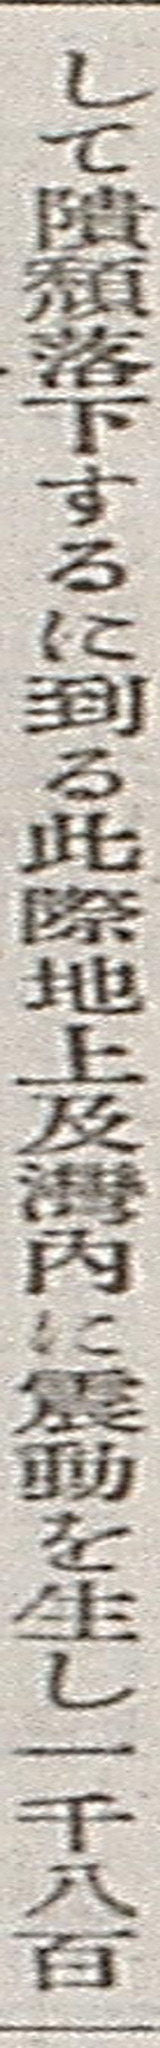して隤頽落下するに到る此際地上及湾内に震動を生し一千八百
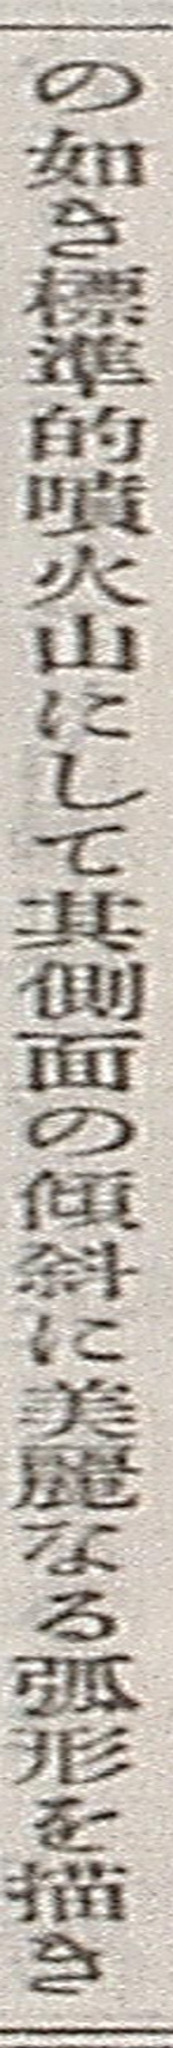の如き標準的噴火山にして其側面の傾斜に美麗なる弧形を描き
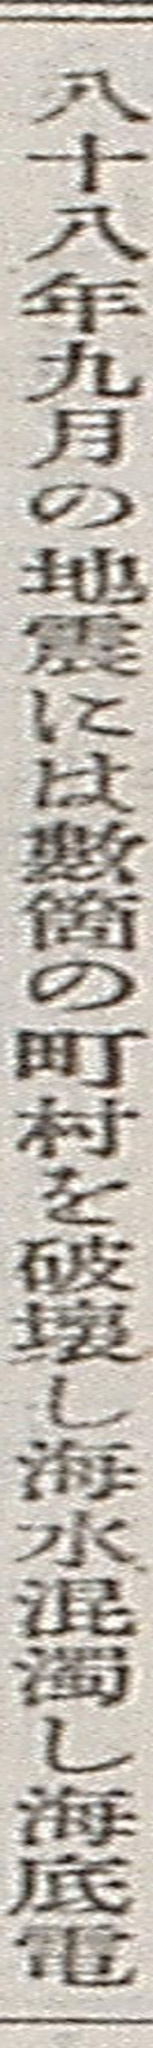八十八年九月の地震には数箇の町村を破壊し海水混濁し海底電
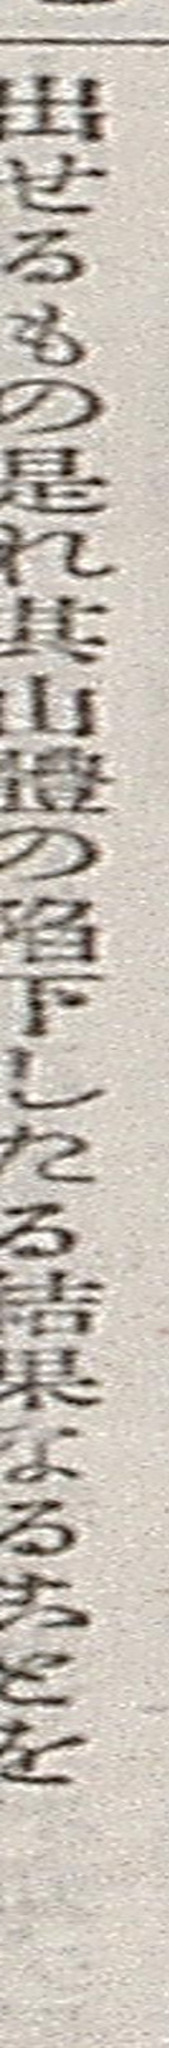出せるもの是れ其山体の陥下したる結果なることを
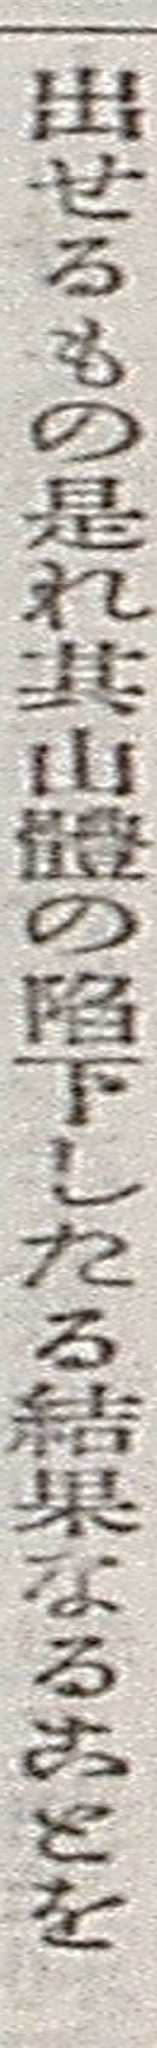出せるもの是れ其山体の陥下したる結果なることを
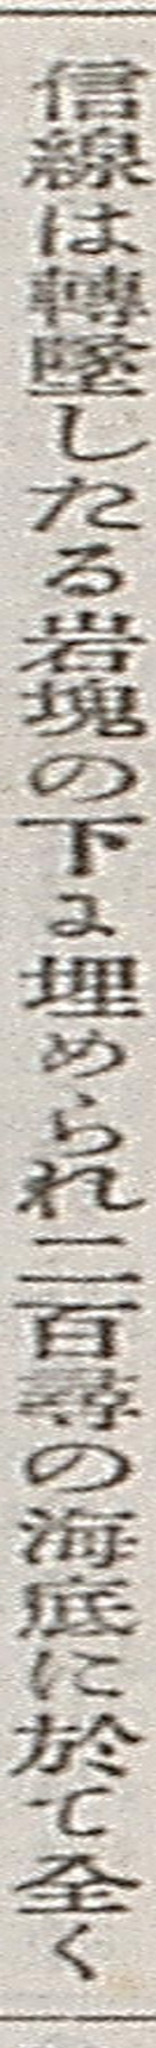信線は転墜したる岩塊の下に埋められニ百尋の海底に於て全く
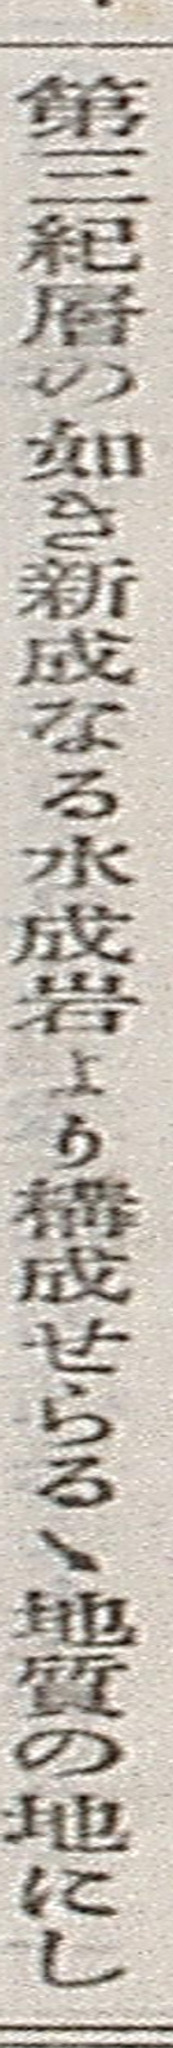第三紀層の如き新成なる水成岩より構成せらるゝ地質の地にし
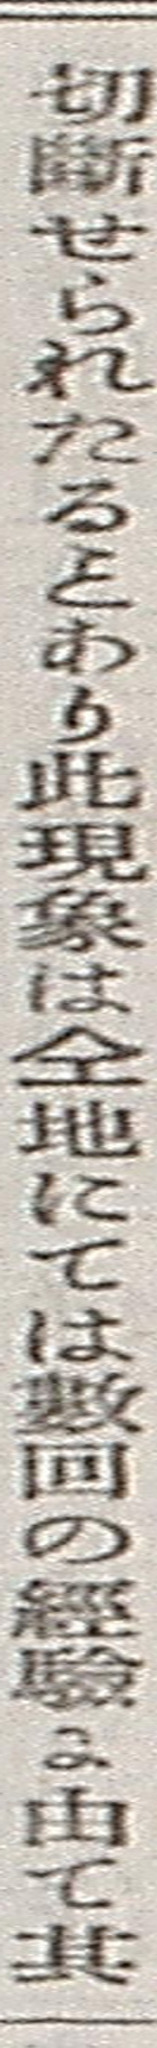切断せられたることあり此現象は同地にては数回の経験に由て其
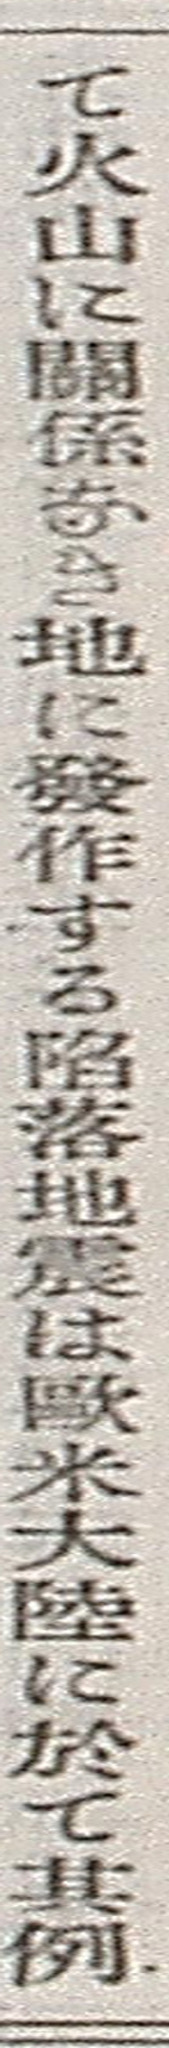て火山に関係なき地に発作する陥落地震は欧米大陸に於て其例
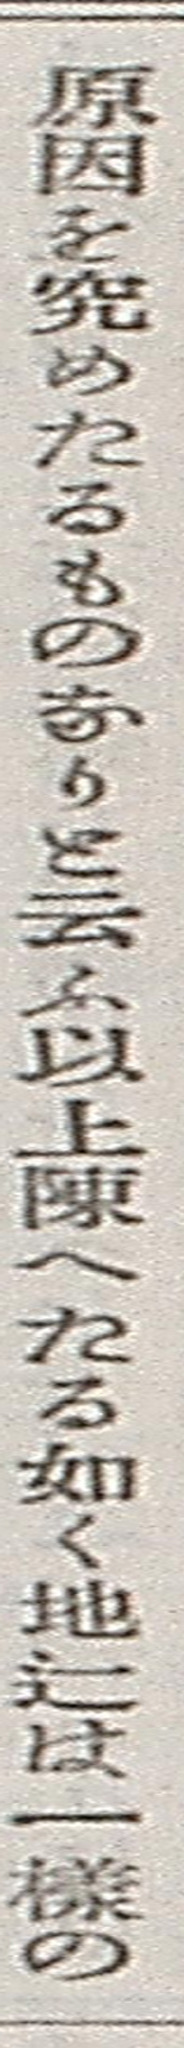原因を究めたるものなりと云ふ以上陳へたる如く地辷は一様の
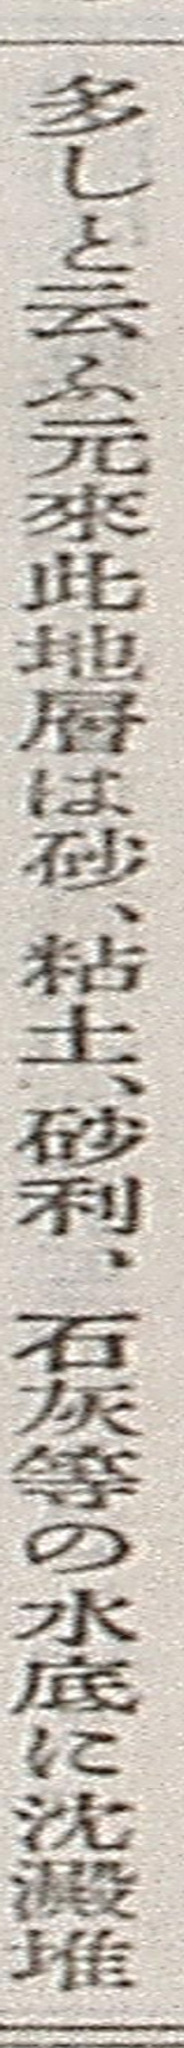多しと云ふ元来此地層は砂、粘土、砂利、石灰等の水底に沈殿堆
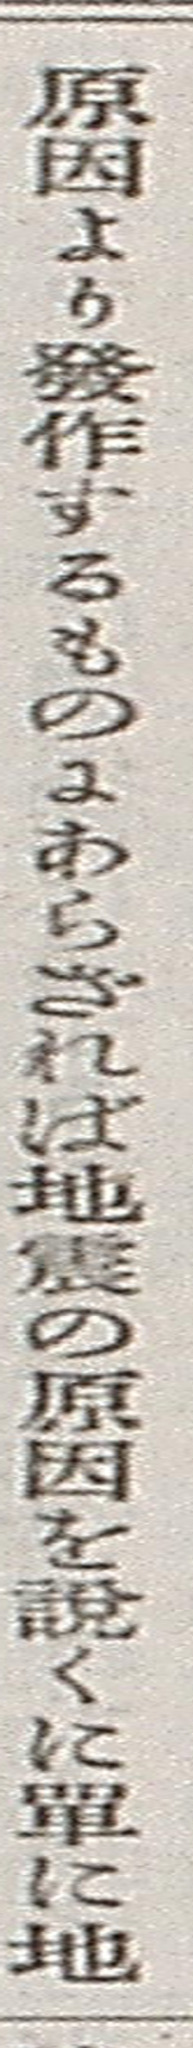原因より発作するものにあらざれば地震の源因を説くに単に地
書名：風俗畫報臨時増刊第百二十號　大海嘯被害録（下）
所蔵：東京大学地震研究所図書室 Earthquake Research Institute Library, The University of Tokyo, JAPAN
